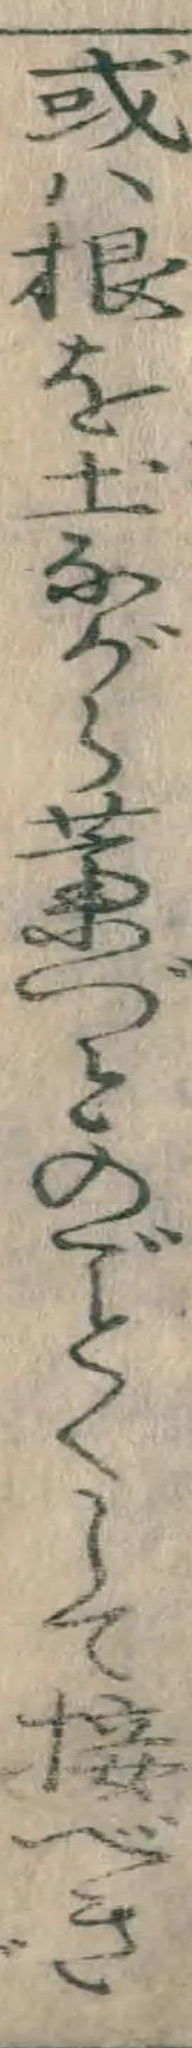或は根を土ながら藁づとのごとくして接べき
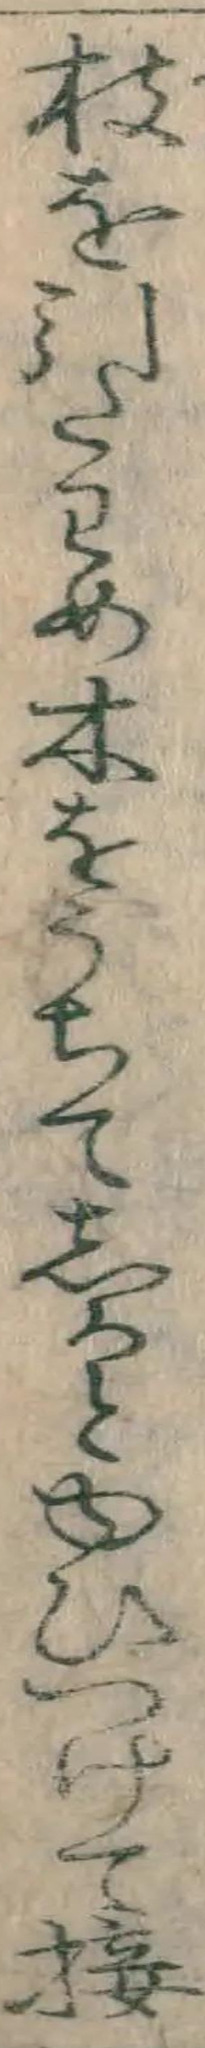枝を引たわめ木をうちてしかとゆひつけて接

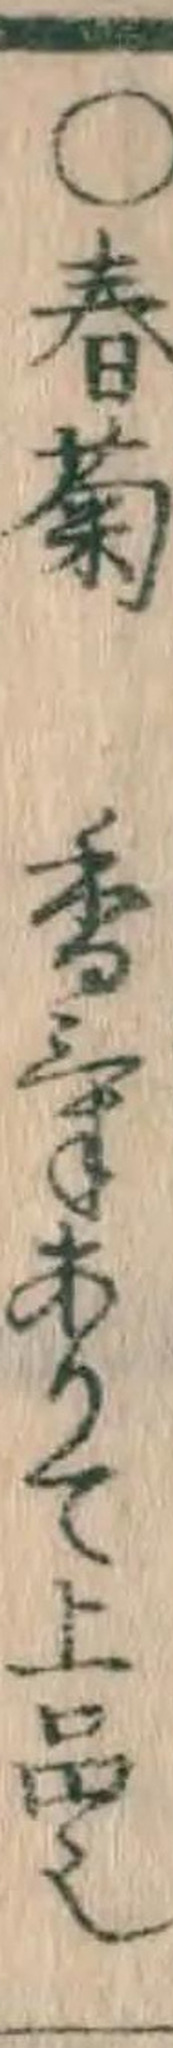○春菊香気ありて上品也
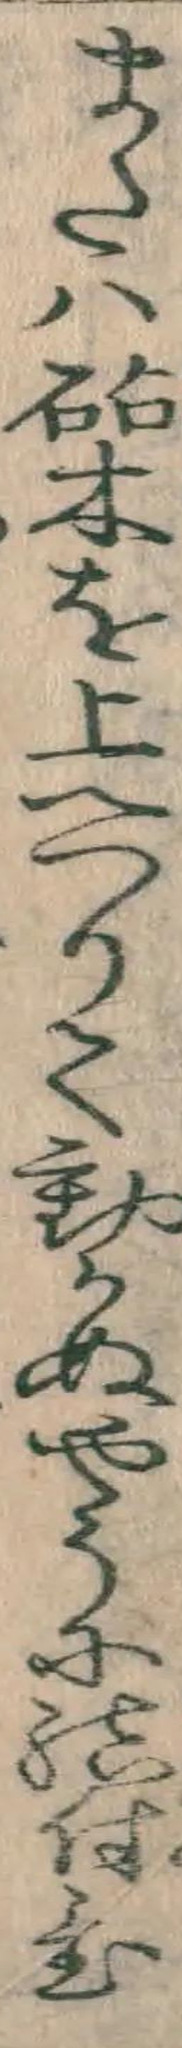または砧木を上へつりて動かぬやうに結付置
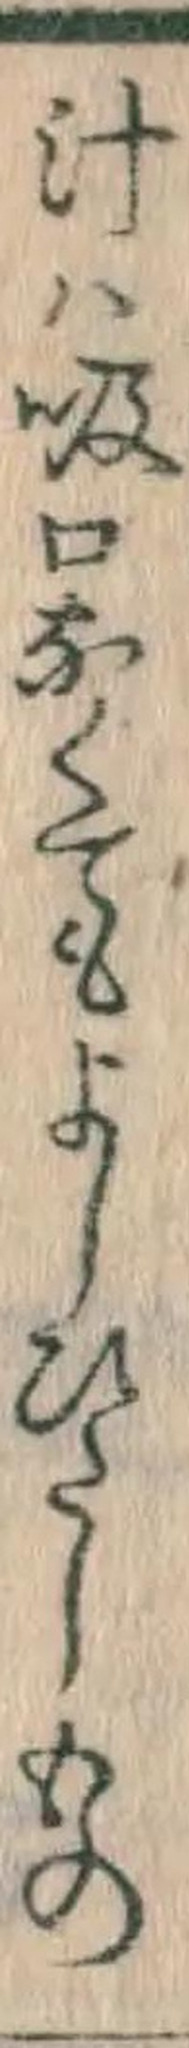汁は吸口なくてもよしひたしもの
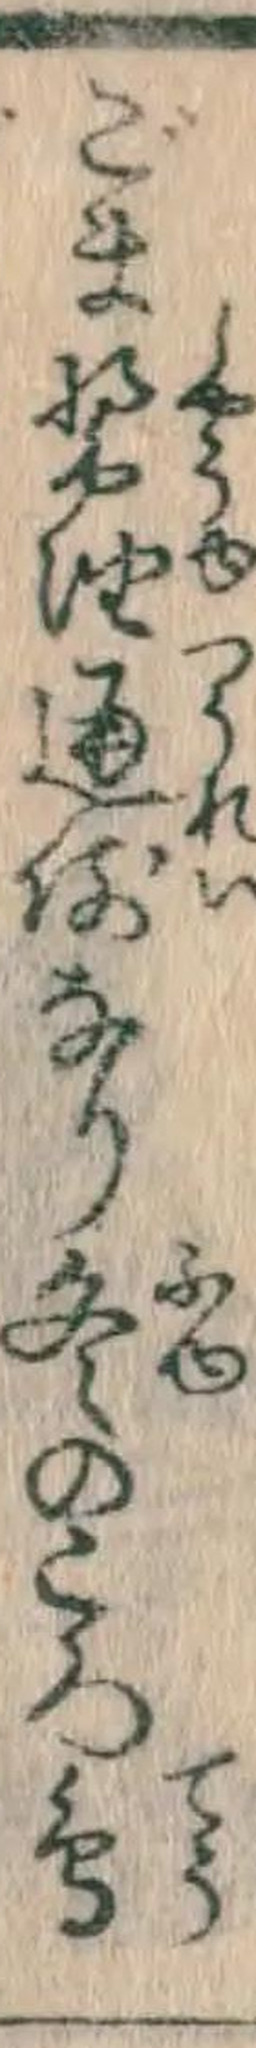ごま醬油通例なり冬のころ鳥
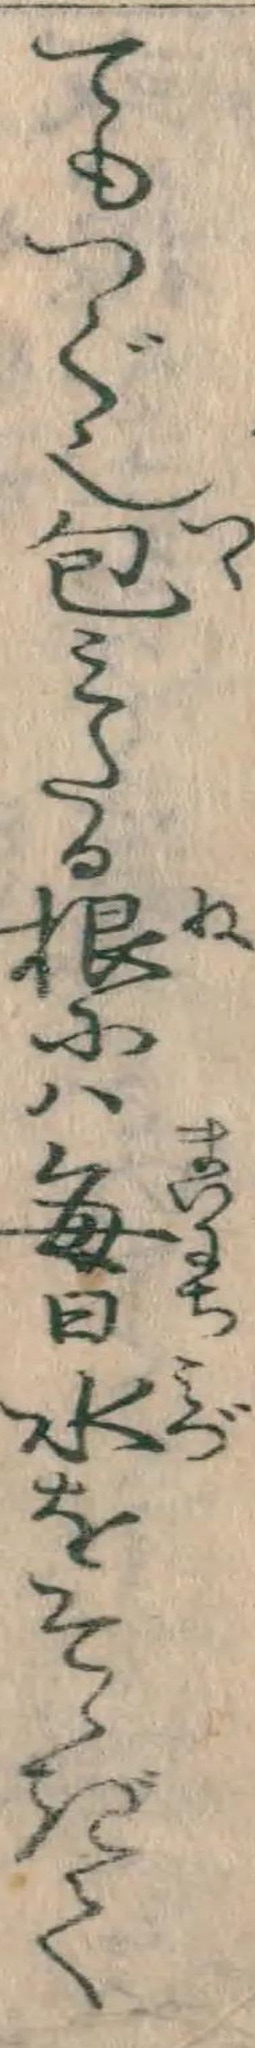てもつぐ也包みたる根には毎日水をそゝぎて
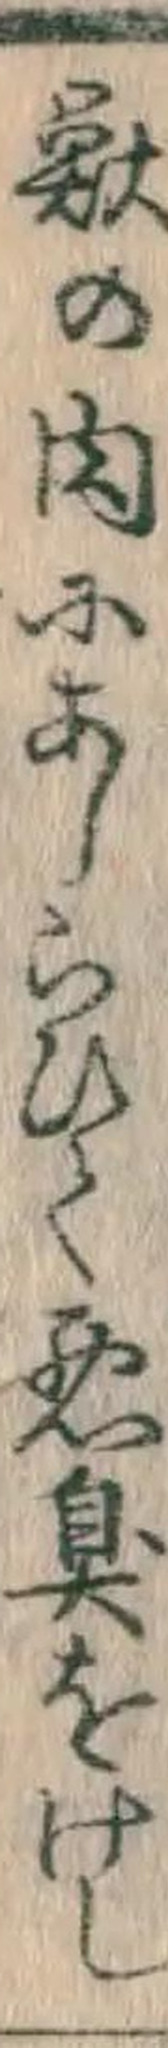獣の肉にあしらひて悪臭をけし
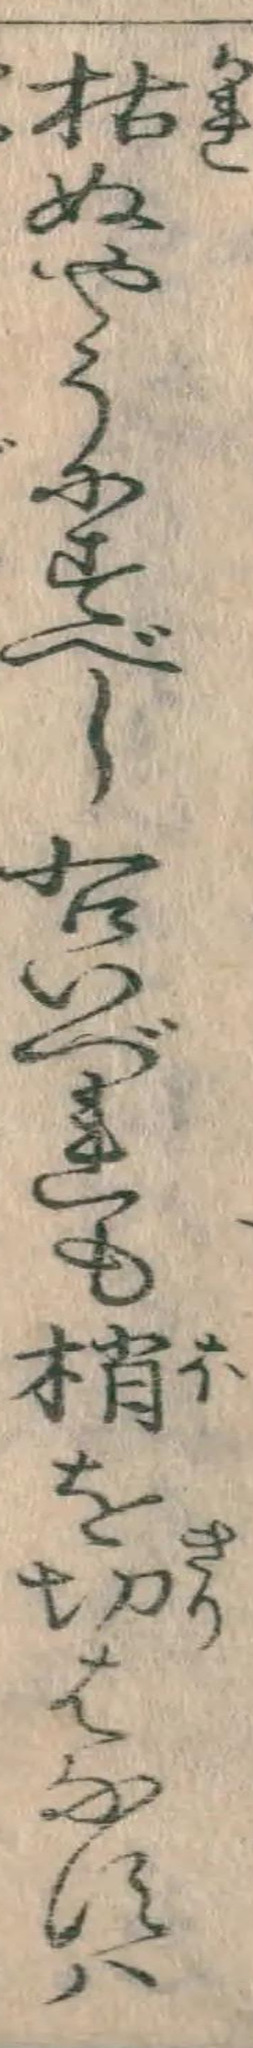枯ぬやうにすべし右いづれも梢を切はなすは
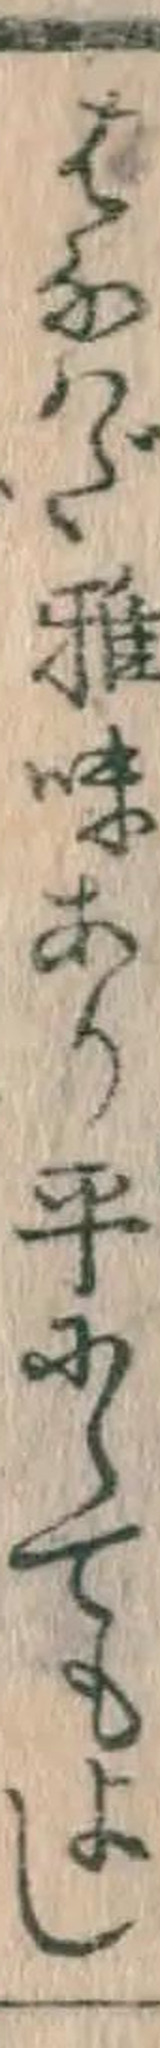はなはだ雅味あり平にしてもよし
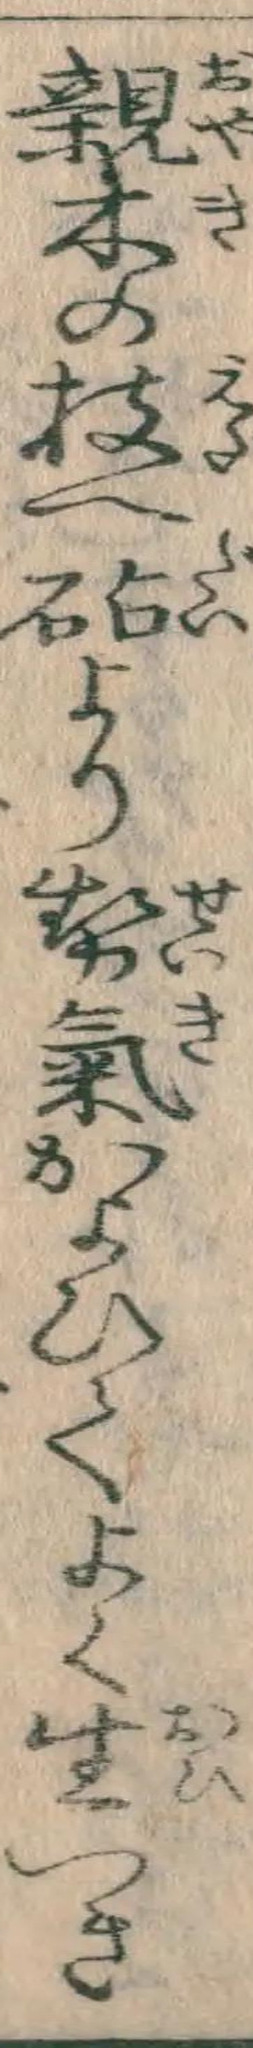親木の枝へ砧より勢気かよひてよく生つき
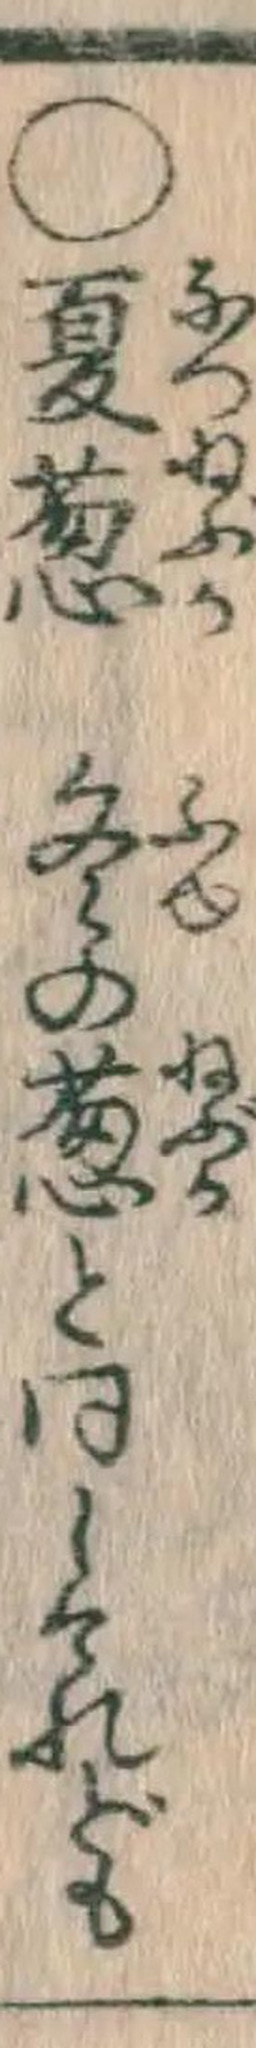○夏葱冬の葱と同しけれども
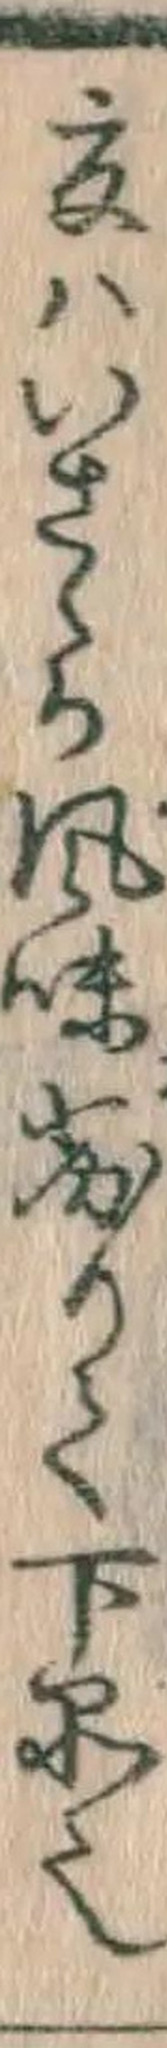夏はいさゝか風味劣りて下品也
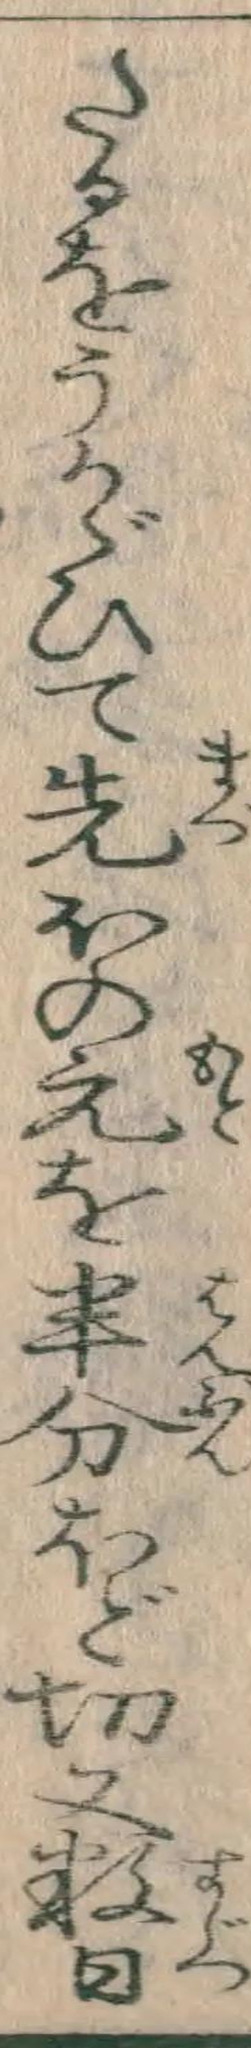たるをうかゞひて先ほの元を半分ほど切又数日
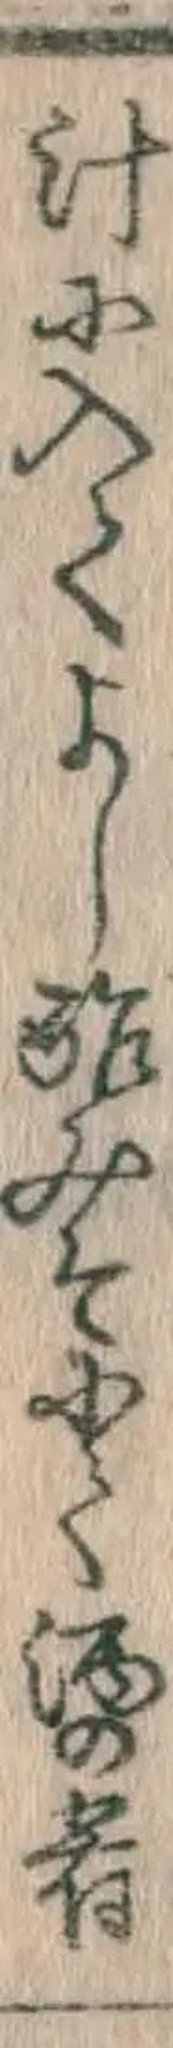汁に入てよし酢みそにて酒の肴
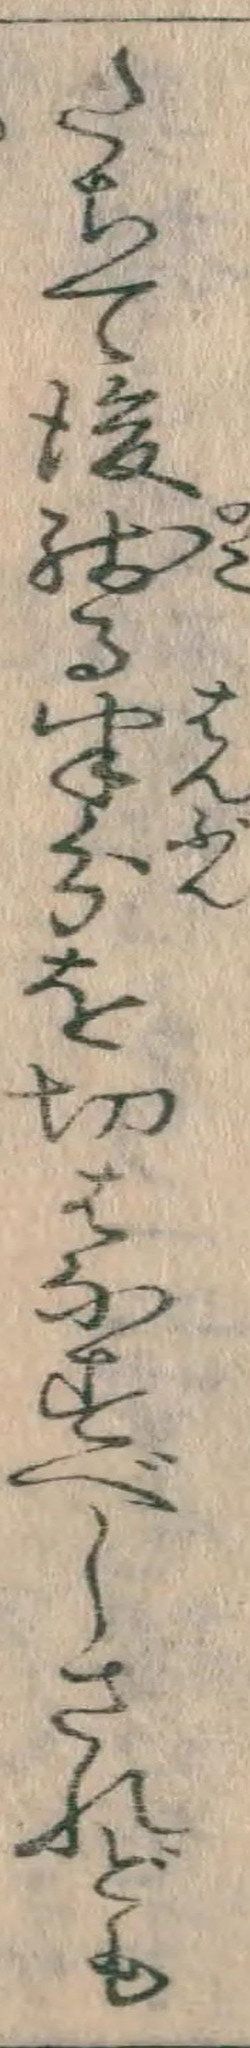たちて後残る半分を切はなすべしされども
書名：広益秘事大全 3巻. [5]
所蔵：国立国会図書館 National Diet Library, JAPAN
